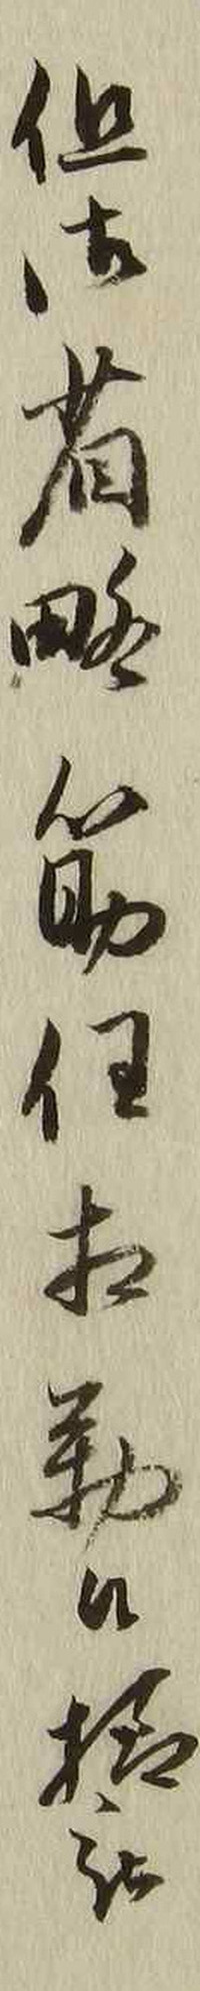但御省略筋任相勤候様被
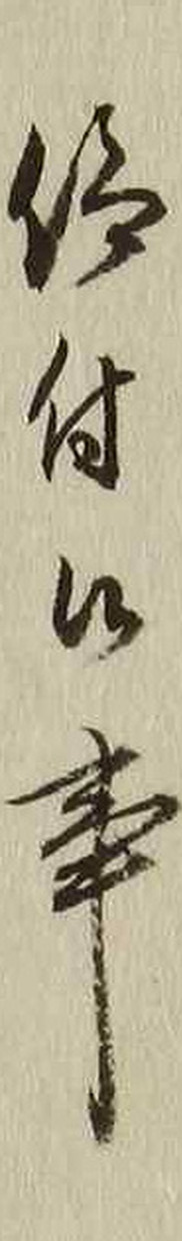仰付候事
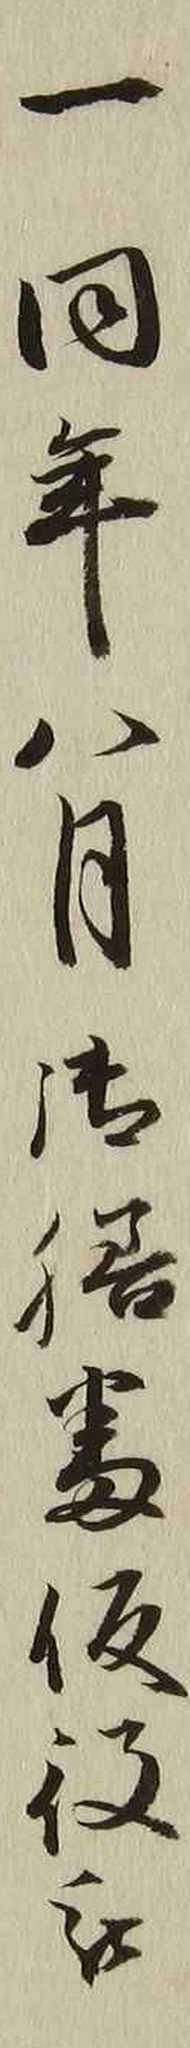一同年八月御膳番仮役被
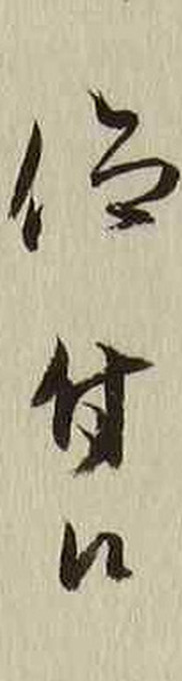仰付候
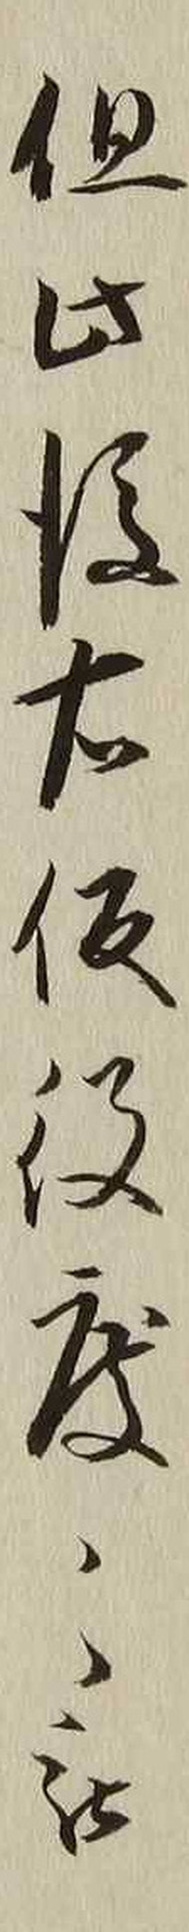但此後右仮役度々被
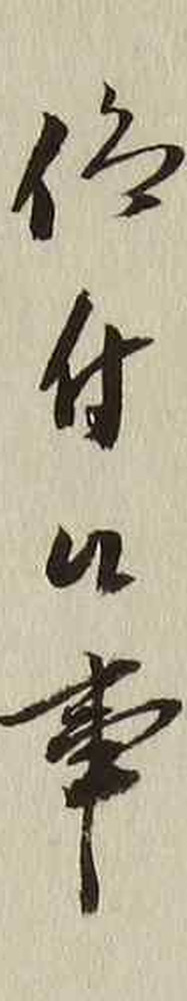仰付候事
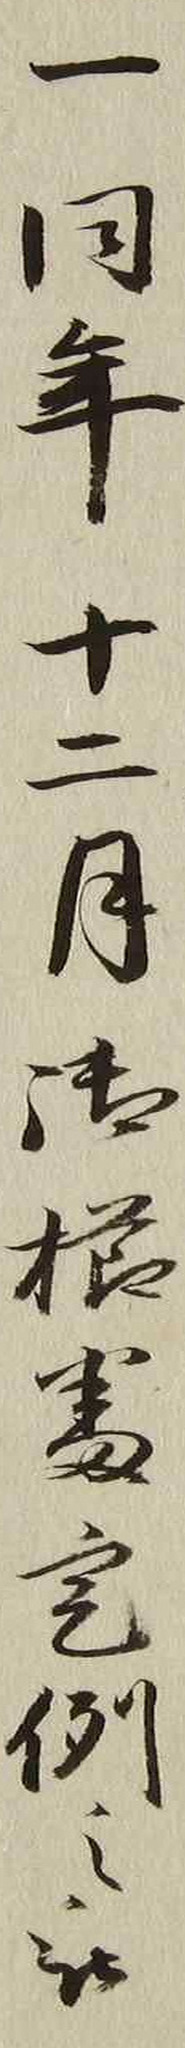一同年十二月御櫛番定例之被
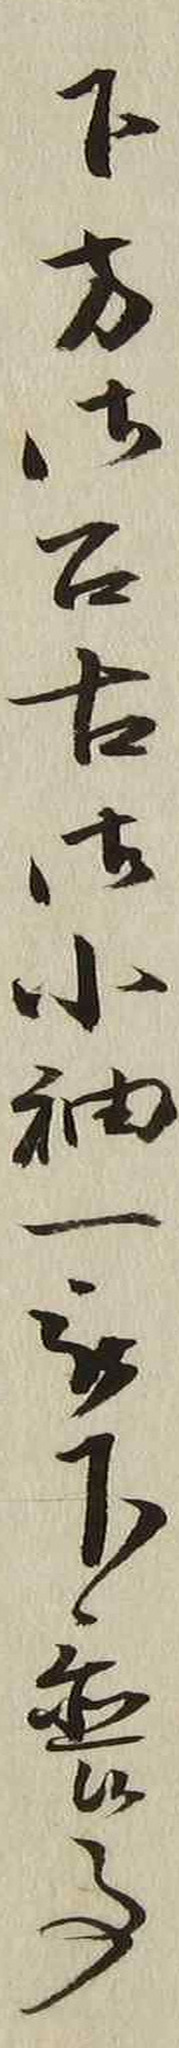下方御召古御小袖一被下置候事
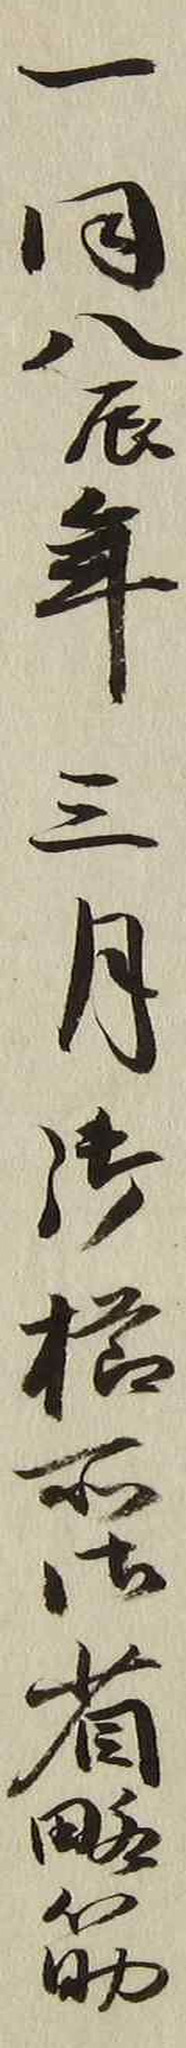一同八辰年三月御櫛所御省略筋
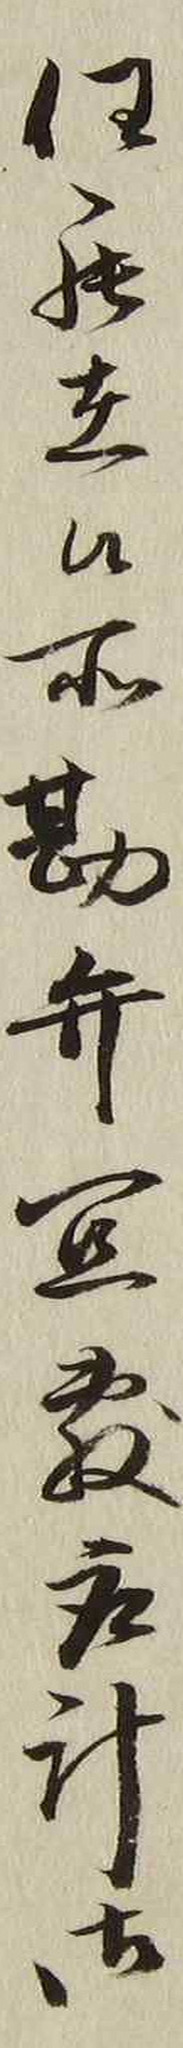任罷在候所勘弁宜敷取計御
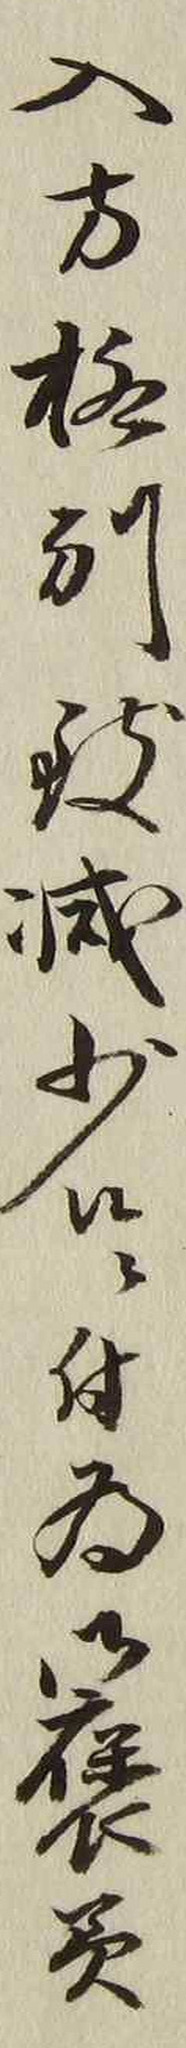入方格別致減少候ニ付為御褒美
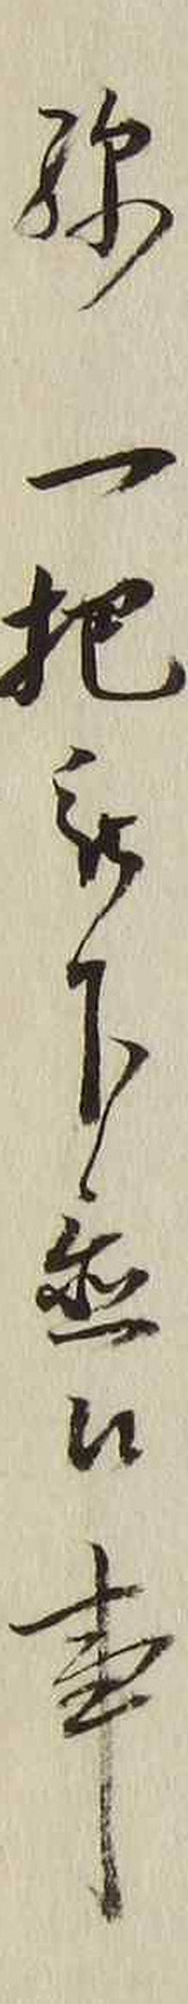綿一把被下置候事
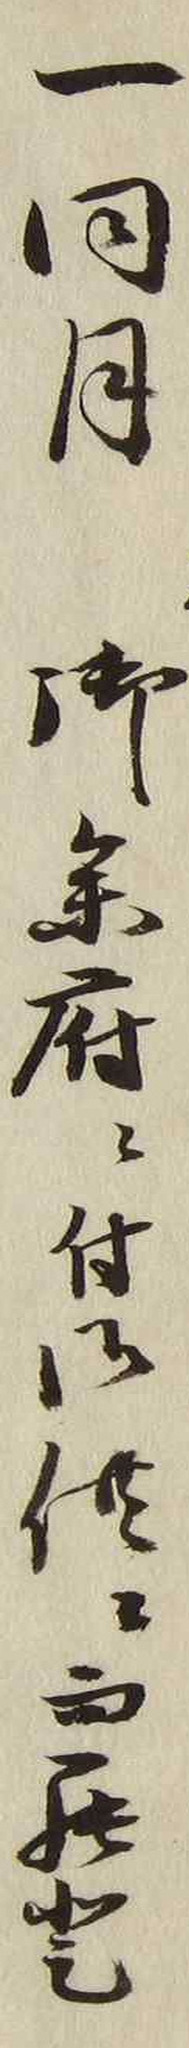一同月御参府ニ付御供ニ而罷登

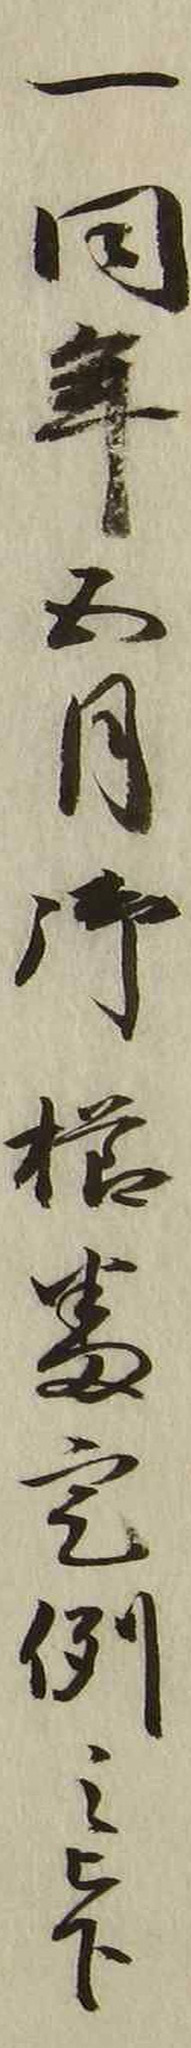一同年五月御櫛番定例之被下
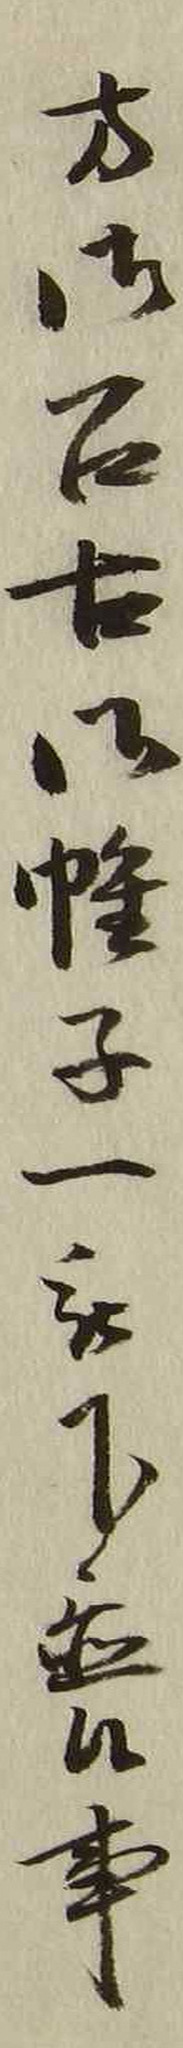方御召古御帷子一被下置候事
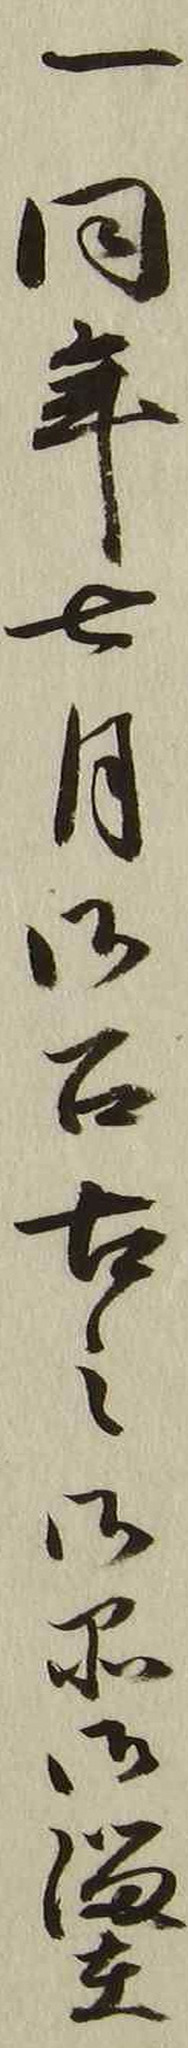一同年七月御召古之御品溜在
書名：諸士系譜　巻之61　と之部4
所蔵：会津若松市立会津図書館
